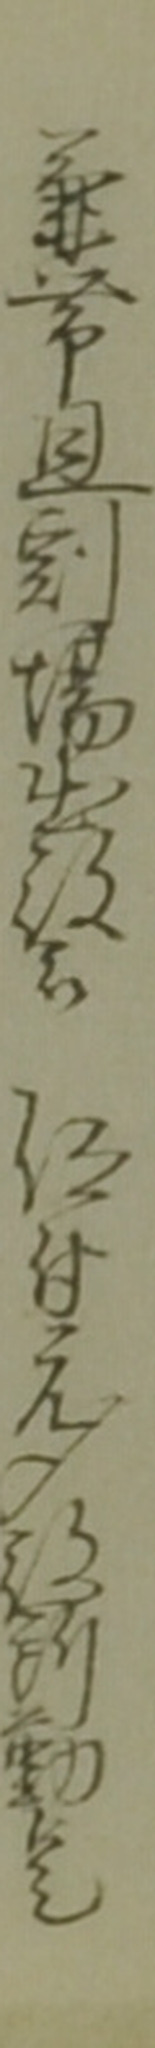兼帯且割場出役被仰付元〆役所勤是
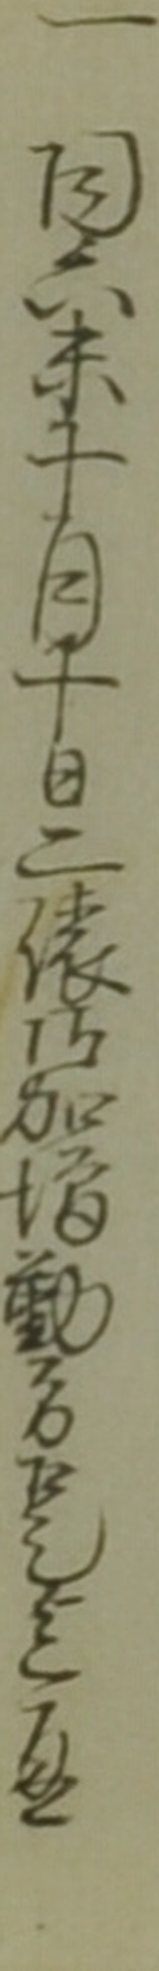一同六未十月十日二俵御加増勤方是迄通
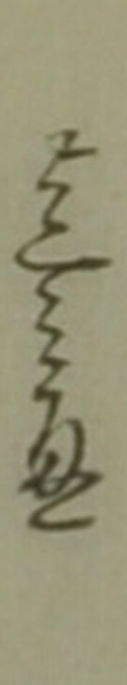迄之通
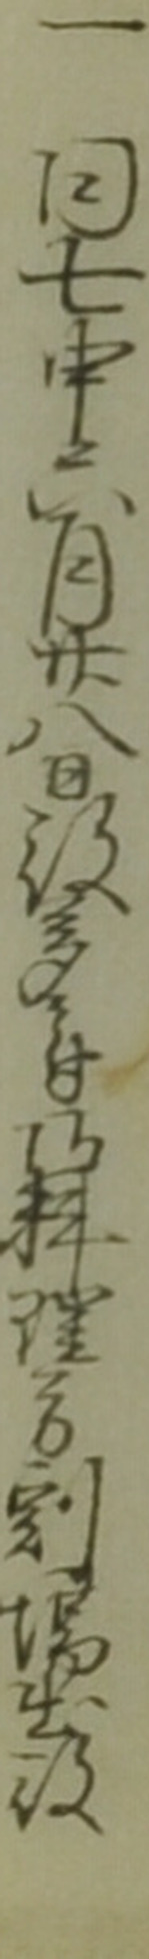一同七申六月廿八日役多ニ付御料理方割場出役
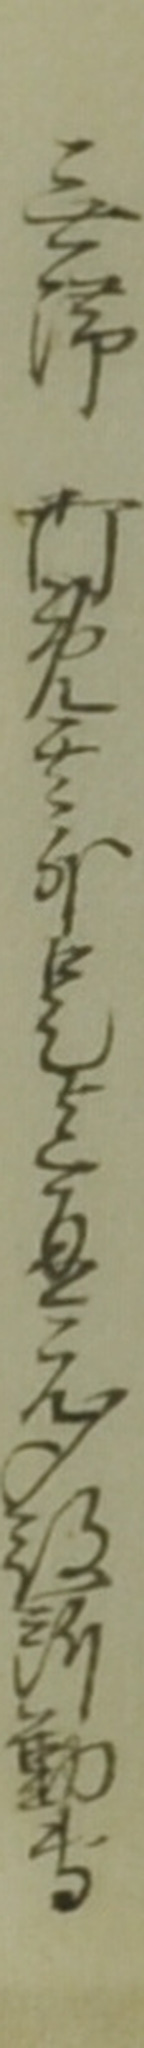無滞御免其外是迄通元〆役所勤専
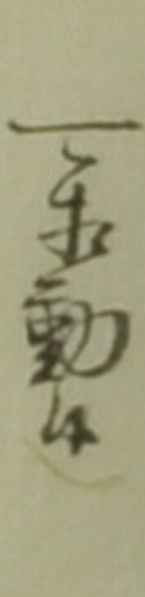可相勤候

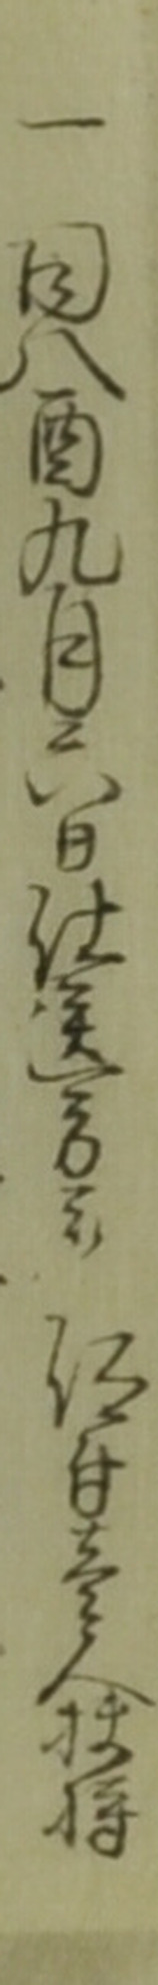一同八酉九月六日仕送方被仰付壱人扶持
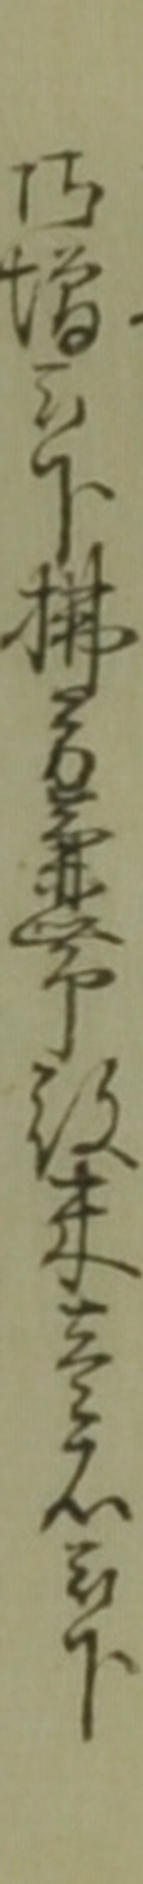御増被下払方兼帯役米壱石被下
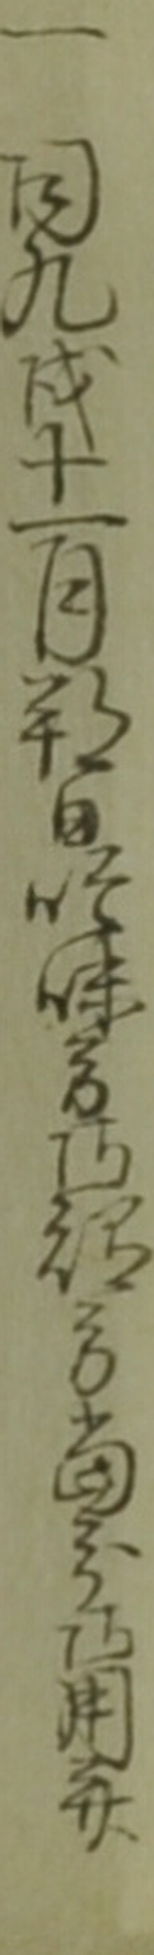一同九戌十一月朔日吟味方御賄方当分御用弁
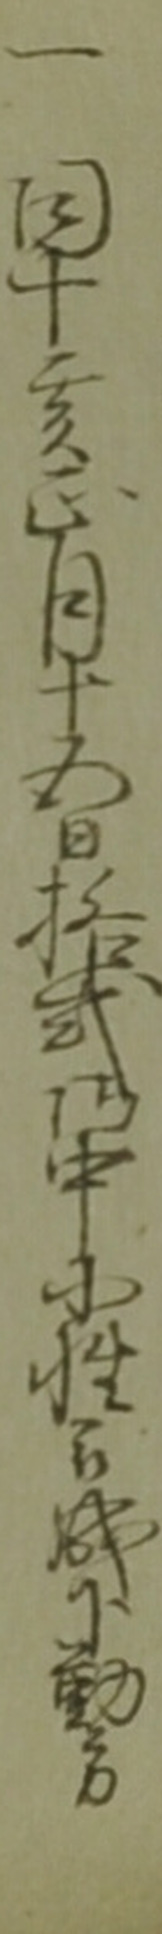一同十亥正月十五日格式御中小性被成下勤方
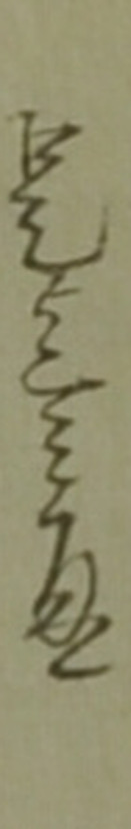是迄之通
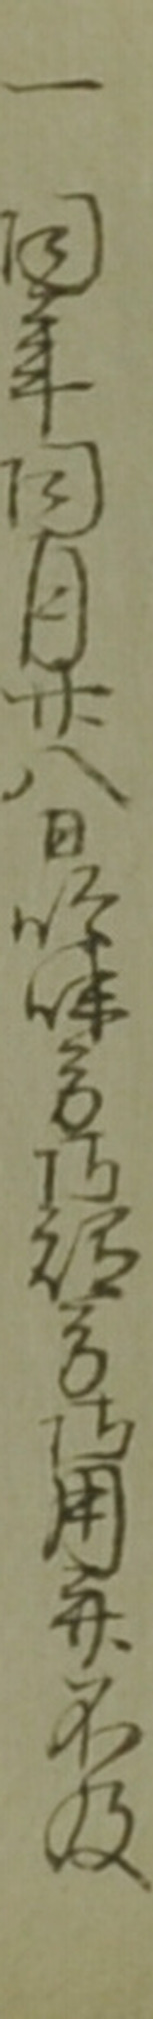一同年同月廿八日吟味方御賄方御用弁不及
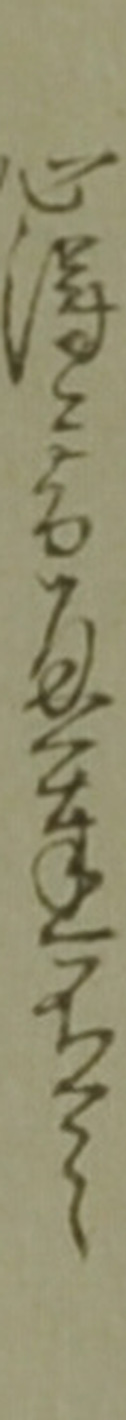心得ニ旨通達有之
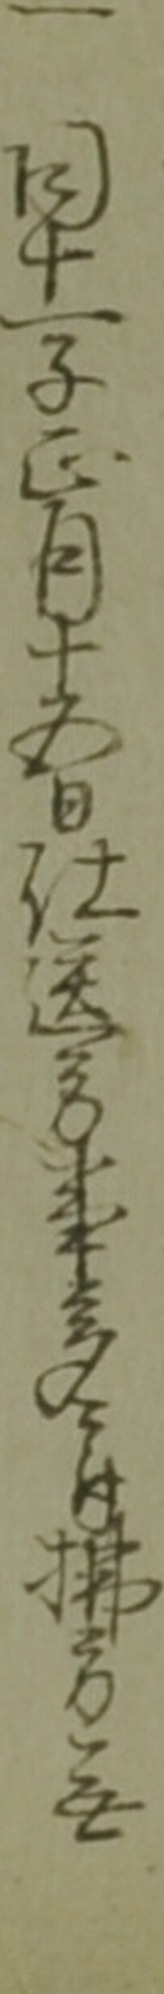一同十一子正月十五日仕送方事多ニ付払方無
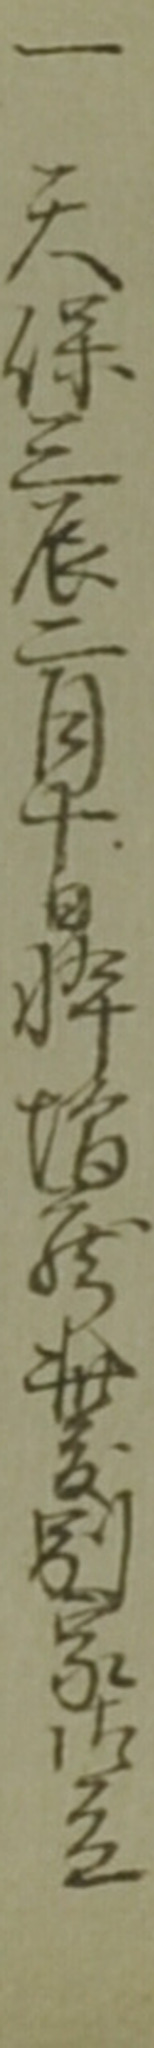一天保三辰二月忰増蔵此度別家御立
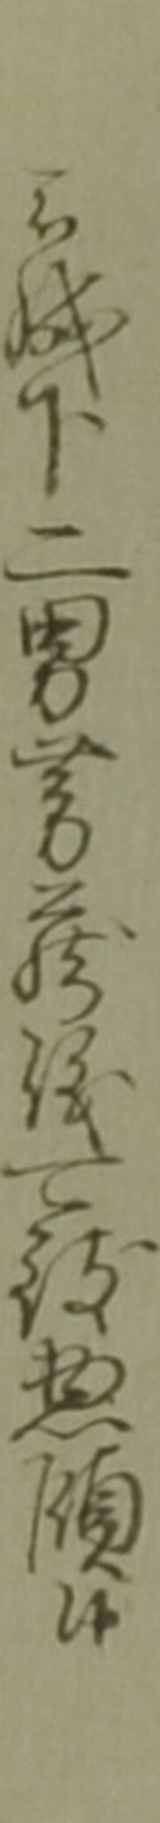被成下二男芳蔵儀可致惣領候
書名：無足諸士勤仕録（一）
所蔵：伊那市立高遠町図書館・合同会社AMANE
